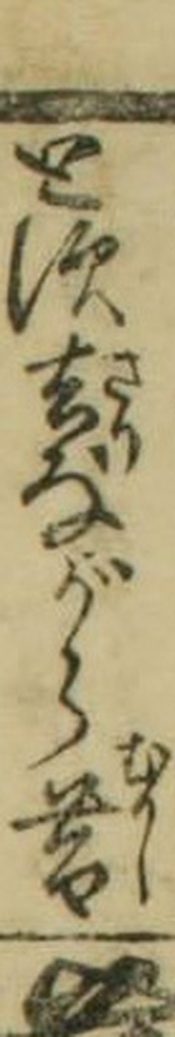とす去ながら昔
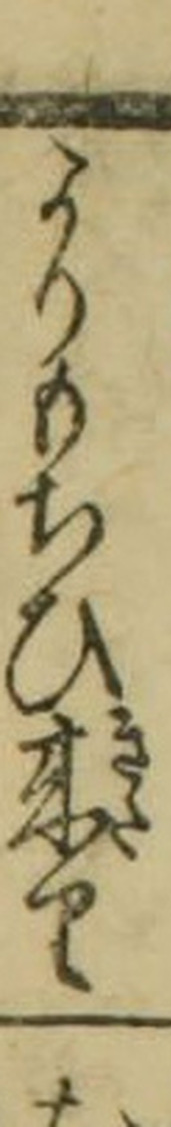よりもちひ来り
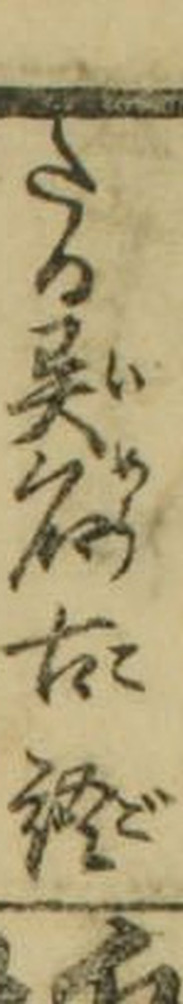たる異名古語
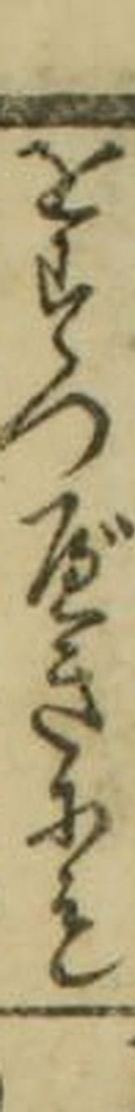をすつべきにも
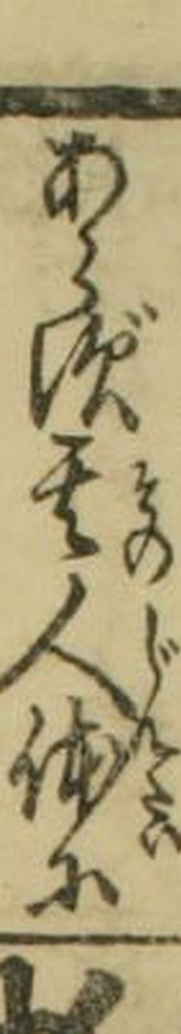あらず其人体に
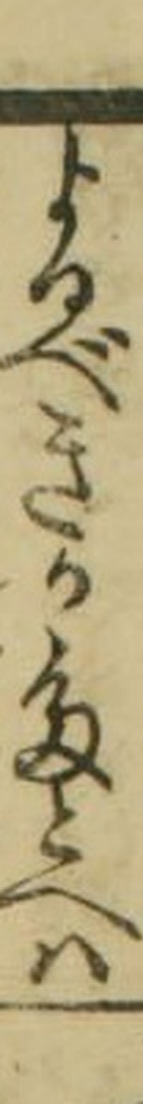よるべきかたとへは
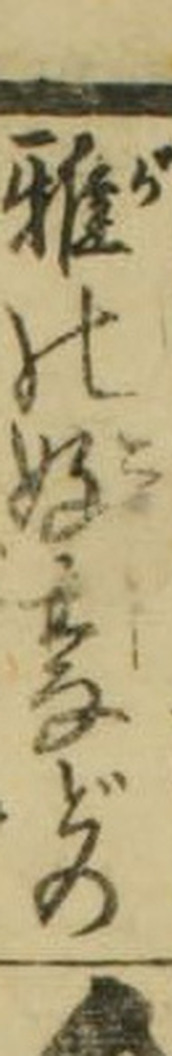雅の好士などの
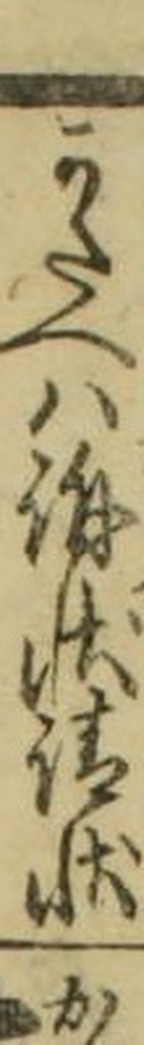かたへは訴状請状
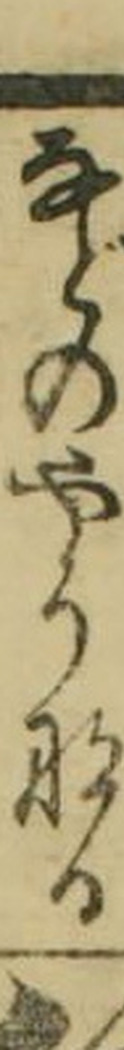などのやうなる
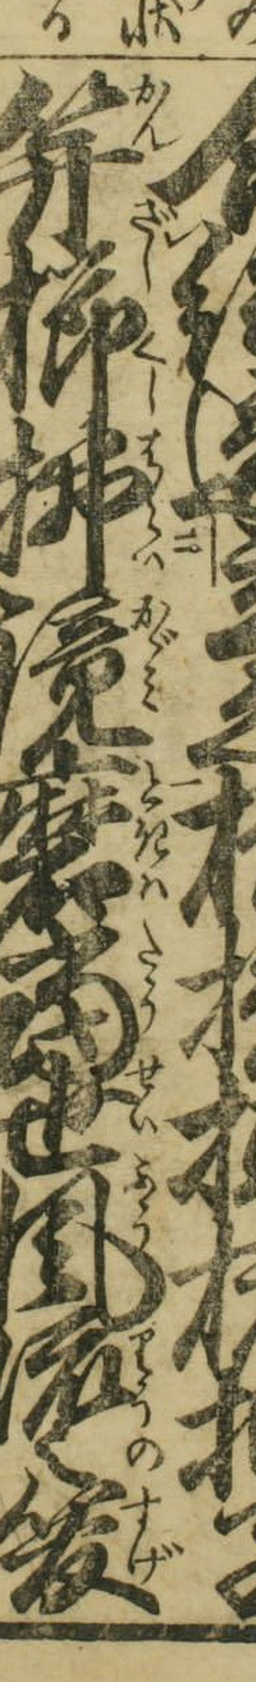笄櫛拂鏡磨当世風流之菅
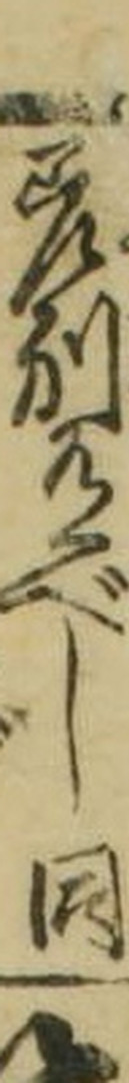差別有べし同
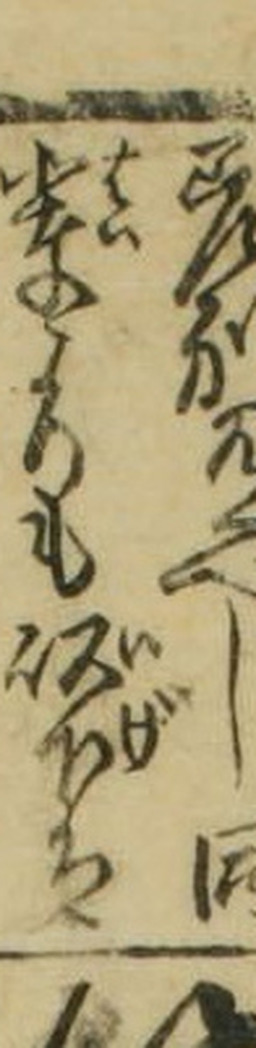輩よりも以下は
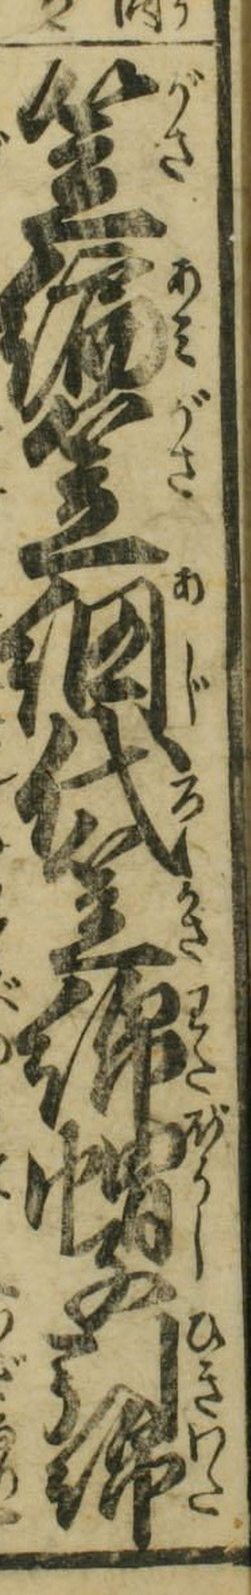笠編笠網代笠綿帽子引綿
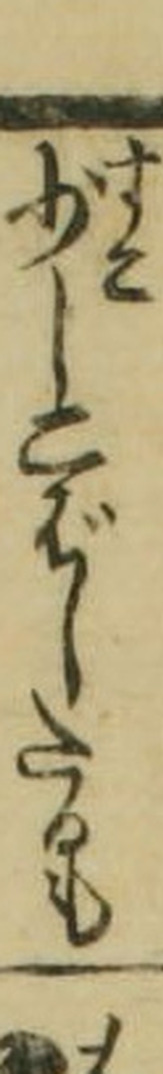少しこばしたるも
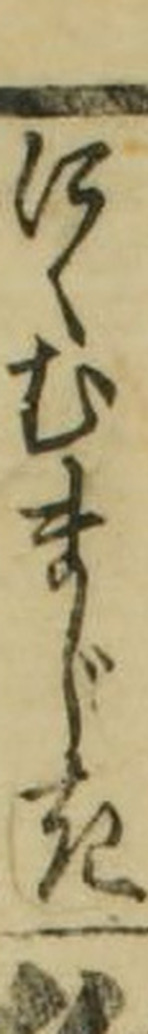にくむまじき
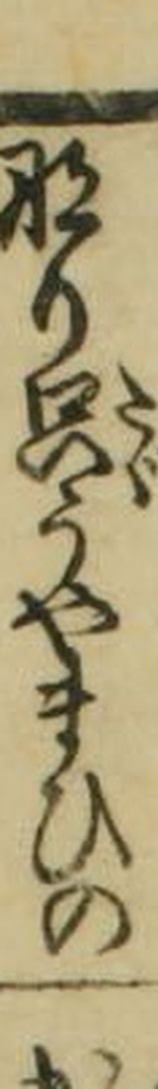なり只うやまひの
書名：増補職人往来
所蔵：東京学芸大学教育コンテンツアーカイブ
